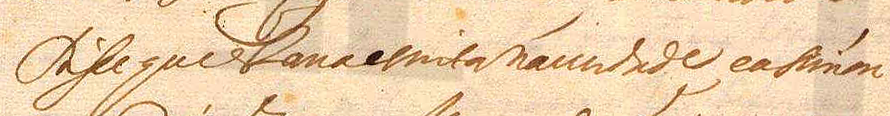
Disse que estaua escrita na uerdade, e assinou
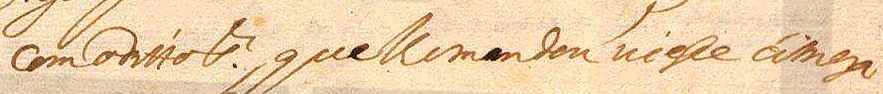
com o ditto s.or que lhe mandou uiesse á meza
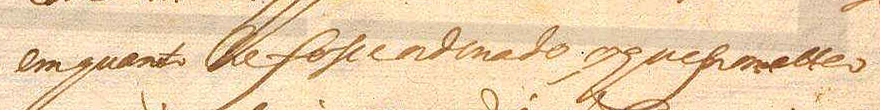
emquanto lhe fosse ordenado o que prometteo
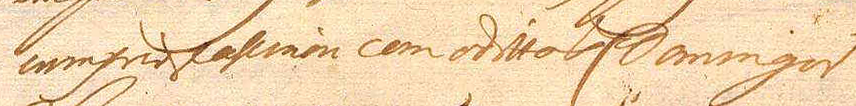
cumprir e assinou com o ditto sor Domingos
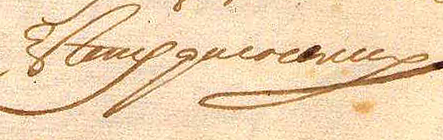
Esteues que o screuy
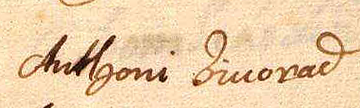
Anthoni Giuorad
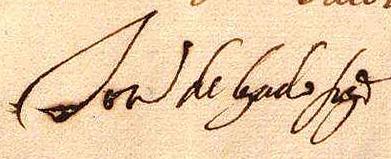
Joā delgado figra
